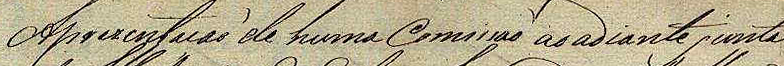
Apresentaçaõ de huma Comissaõ ao adiante junta
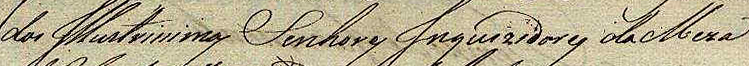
dos Jllustrissimos Senhores Jnquizidores da Meza
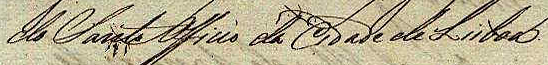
do Santo Officio da Cidade de Lisboa.
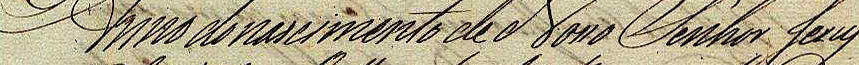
Anno do nascimento de Nosso Senhor Jesus
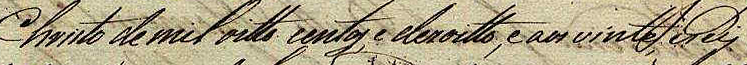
Christo de mil oitto centos e dezoitto, e aos vinte e seis
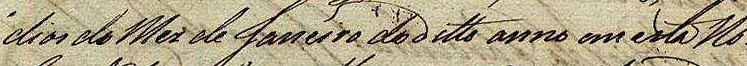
dias do Mez de Janeiro do ditto anno em esta No
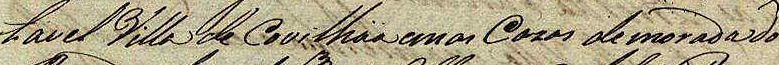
tavel Villa de Covilhaa em as Cazas de morada do
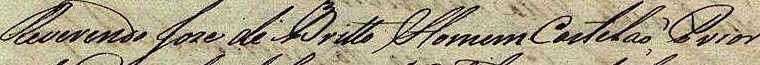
Reverendo Joze de Britto Homem Castelaõ, Prior
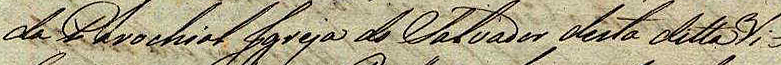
da Parochial Jgreja do Salvador desta ditta Vi
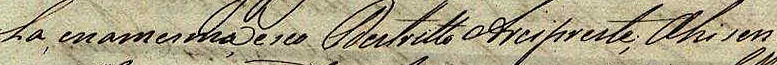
la, e na mesma, e seo Destritto Arcipreste, ahi sen
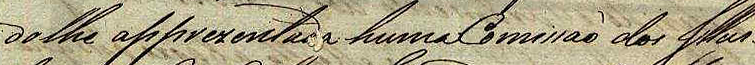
do lhe apprezentara huma Comissaõ dos Jllus
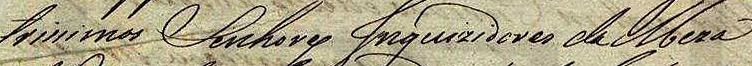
trissimos Senhores Jnquizidores da Meza
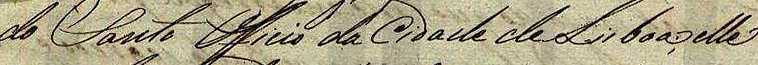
do Santo Officio da Cidade de Lisboa; elle
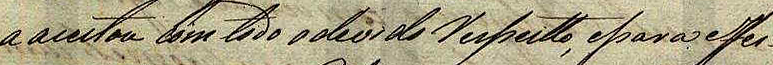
a aceitou com todo o devido Respeitto, e para effei
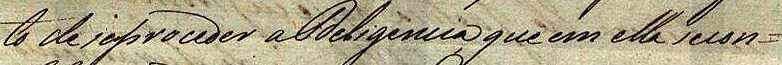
to de se proceder a Deligencia que em ella se con
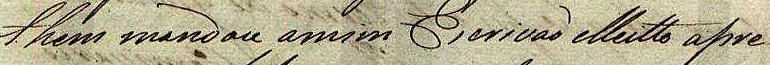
them mandou a mim Escrivaõ elleito apre
